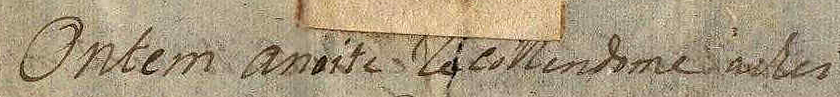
Ontem a noite Recolhendome achei
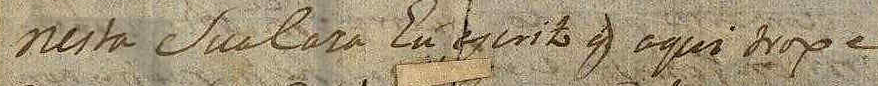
nesta Sua Caza hū escrito q̄ aqui troxe
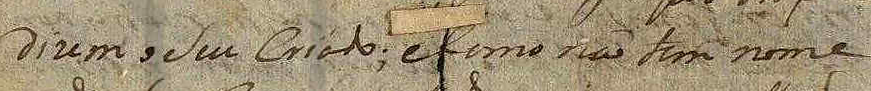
dizem o seu Criado, e Como naõ tem nome
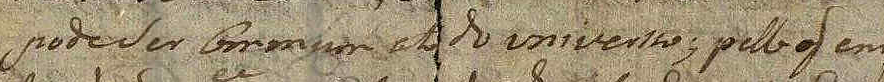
pode ser commum a todo universso; pello q̄ em
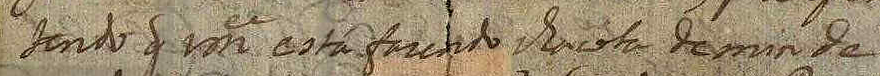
tendo q̄ vmce está fazendo chacota de min de
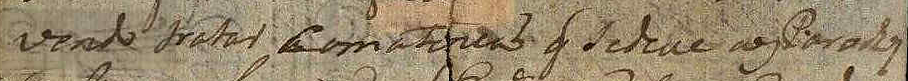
vendo tratar com atençaõ q̄ se deue aos Parochos
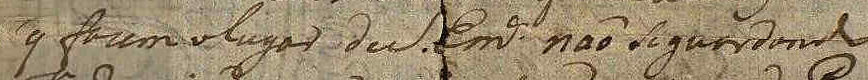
q̄ fazem o lugar de S. Em.a naõ se guardando
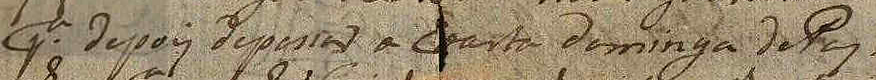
p.a depois de passar a coarta dominga de Pas
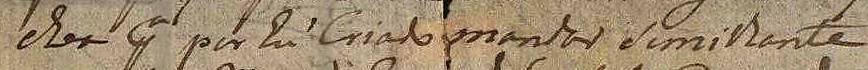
choa pa por hū Criado mandar semilhante
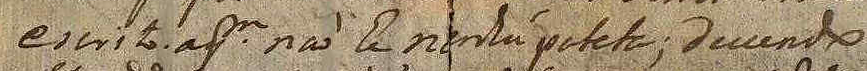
escrito a q.m naõ he nenhū pateta; deuendo
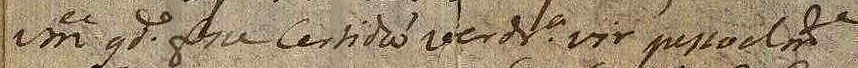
vmce qd.o fosse certidaõ verdr.a vir pessoalm.te
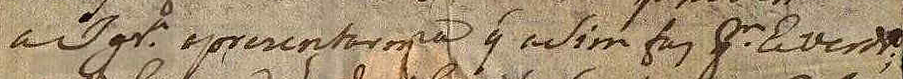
a Igr.a aprezentarma q̄ asim fas qm. he verdr.o
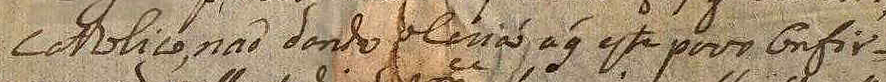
catholico, naõ dando oCaziaõ a q̄ este povo Confir
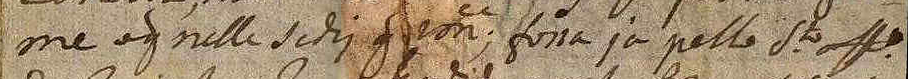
me o q̄ nelle se dis q̄ vm.ce; fossa ja pello s.to off.o
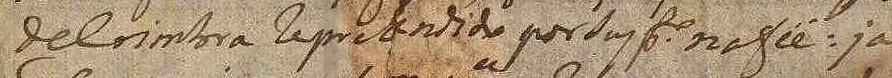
de Coimbra Reprehendido por susp.to na féé: ja
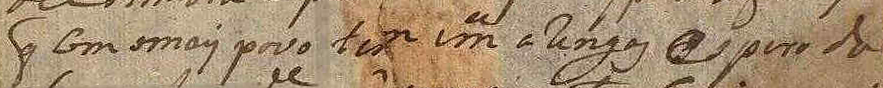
q̄ com o mais povo tem vmce aRengos Espero da
